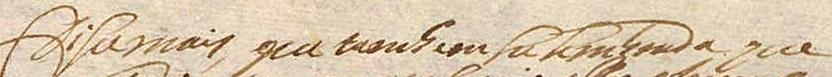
Disse mais que tambem he lembrada que
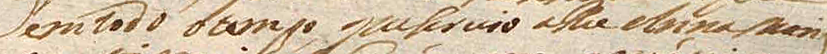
em todo o tempo que seruio a Ree Anna Maria
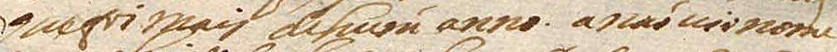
que foi mais de hum anno a naõ uio nome
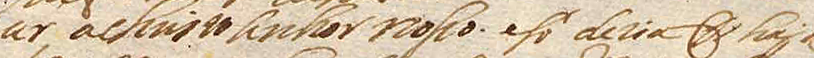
ar, a christo senhor nosso. e só dezia Ds̄ haja
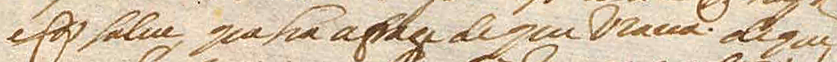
e Ds̄ salue que ha a frase de que Vzaua de que
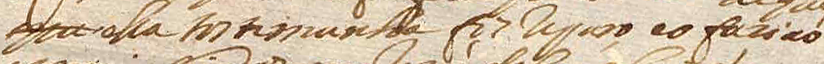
que ella testemunha fez Reparo e o faziaõ
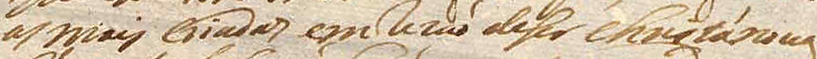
as mais criadas em Rezaõ de ser christã noua
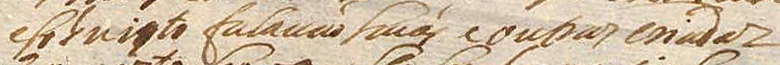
e sobre isto falauão huãs e outras criadaz
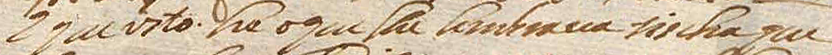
E que isto he o que lhe lembraua tinha que
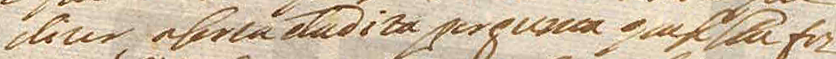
dizer, aserca da dita pergunta que se lhe fez
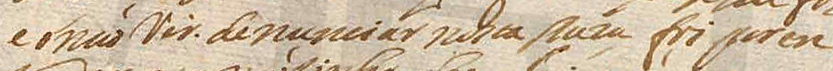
e o naõ Vir. denunciar nesta Meza foi por en
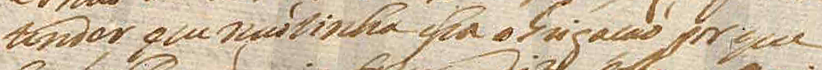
tender, que naõ tinha essa obrigaçaõ porque
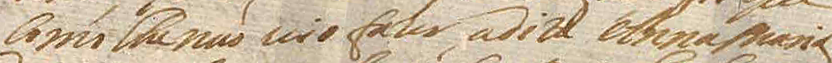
como lhe naõ uio fazer, a ditta Anna Maria
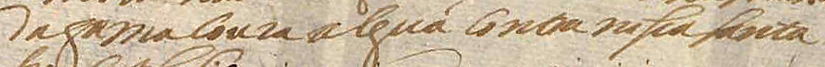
da gama couza alguā contra nossa santa
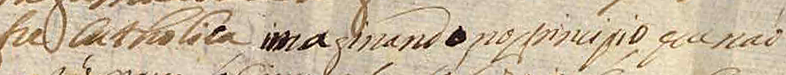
fee catholica, imaginando, no principio, que naõ
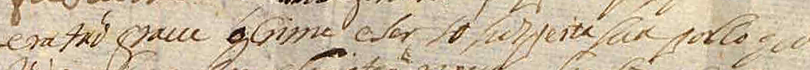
era taõ graue o crime e ser so suspeita sua pollo que
